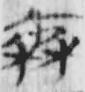秦
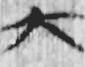大
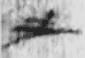之
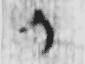人
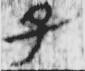子
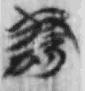肅
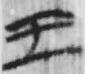王
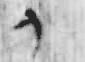人
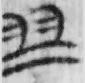翏
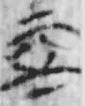亞
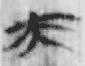夫
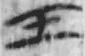壬
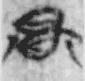晨
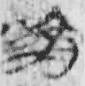豫
